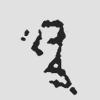夏
